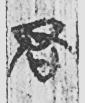君
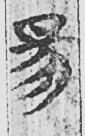昜
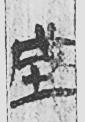城
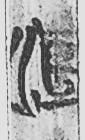洹
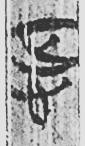{正心}
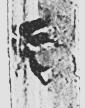君
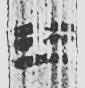三
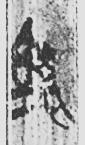執
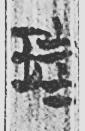珪
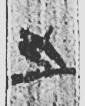之
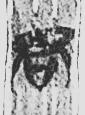君
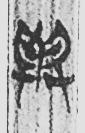與
